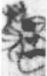○（貍）
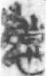○（貘）
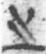之
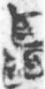聶（攝）
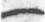一
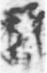○（縣）
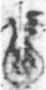○（箙）
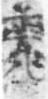彔（綠）
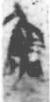魚
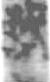敮
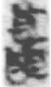聶（攝）
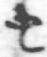屯
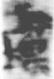○（纁）
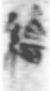○（組）
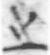之
